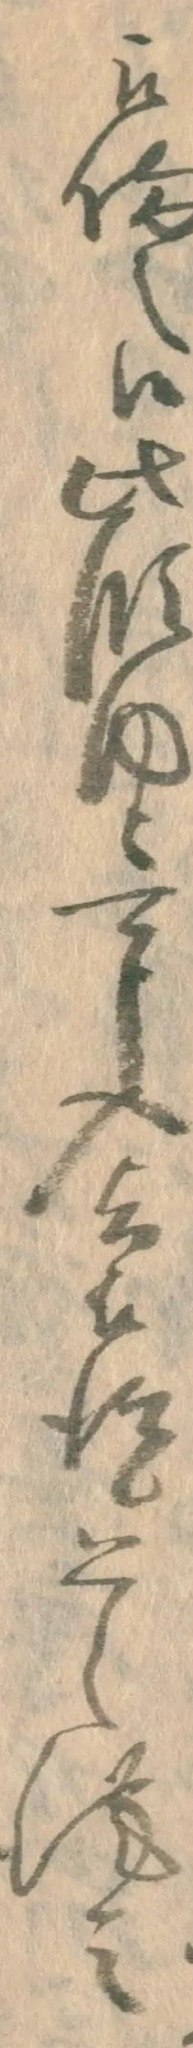被備之候此段内々可申入旨被仰候恐々謹言
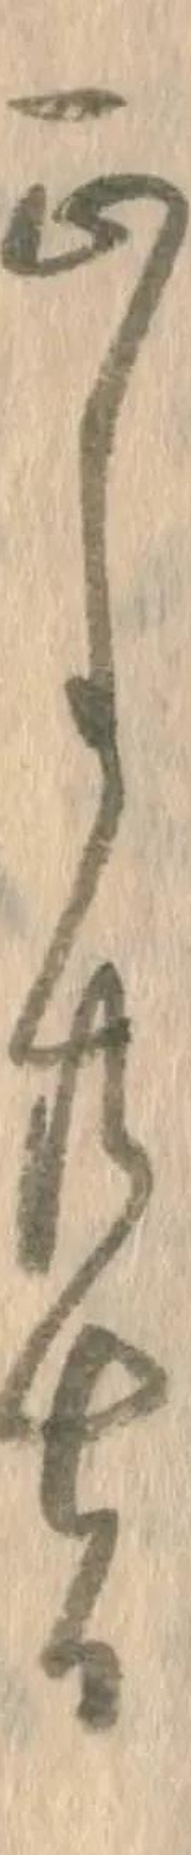正月廿七日
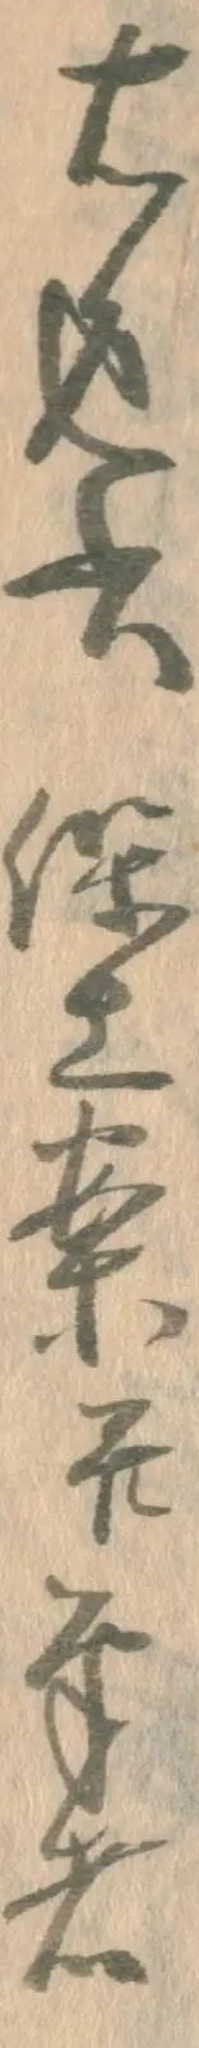右返書保土案并筆者
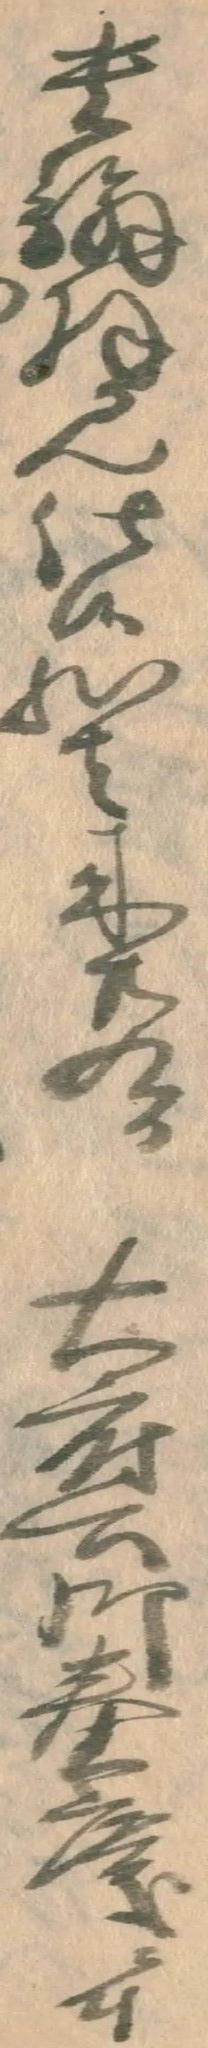貴翰拝見仕候然者来廿九日右府公御奏慶ニ付
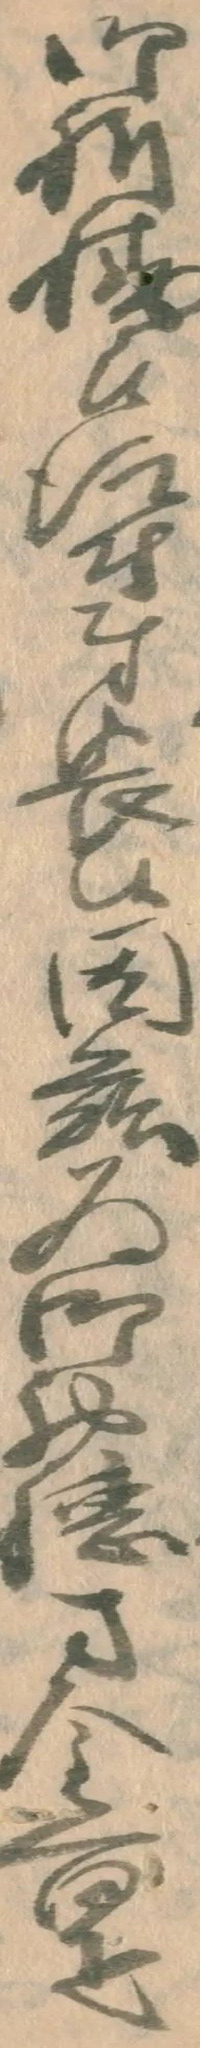御祈祷被仰付奉畏候因茲為御初穂方金百疋
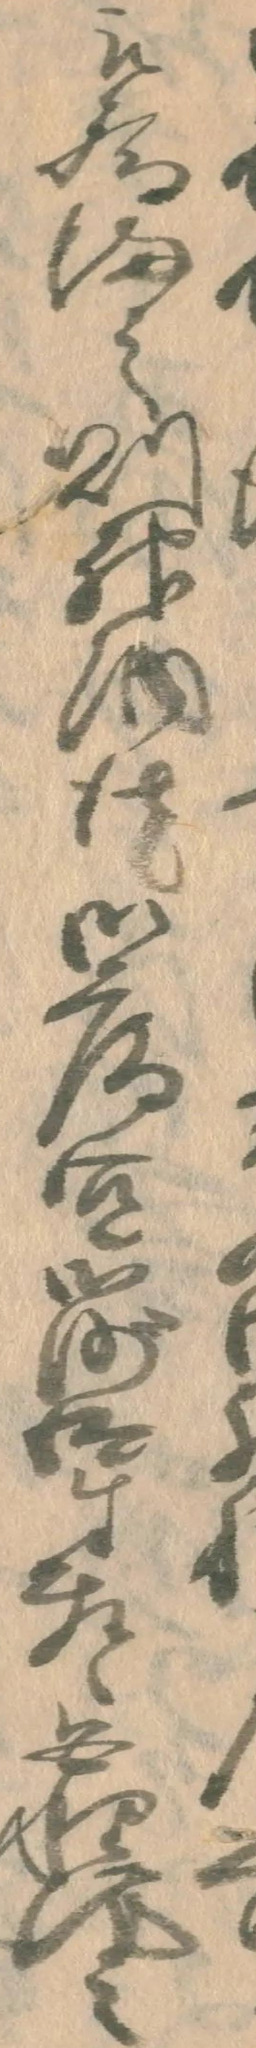被為備之則神納仕候御序宜御沙汰奉頼候恐惶謹言
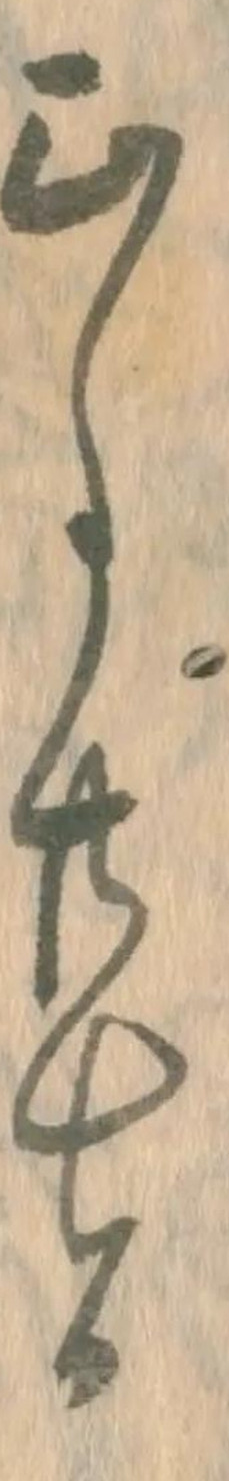正月廿七日
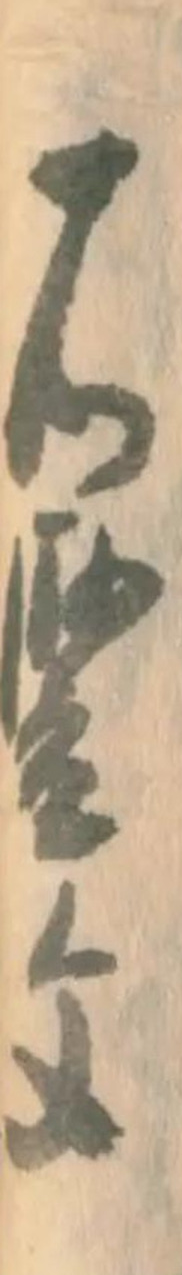右竪文
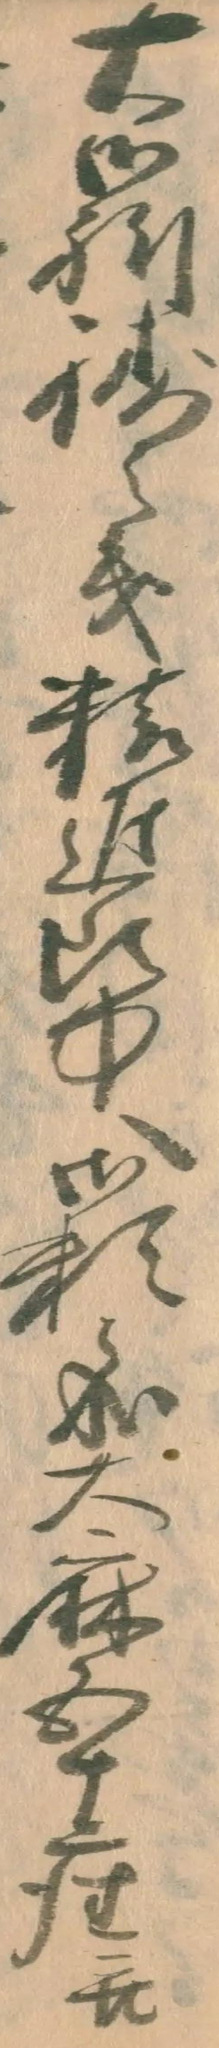右御祈祷之義精進頭中へ御頼被成大麻五十座并
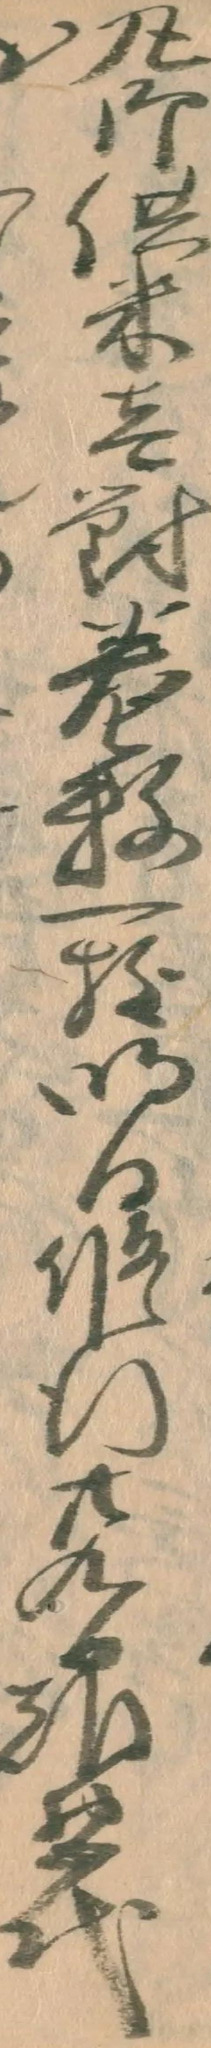丸御供米壱対巻数一枝明日修行廿九日朝惣代
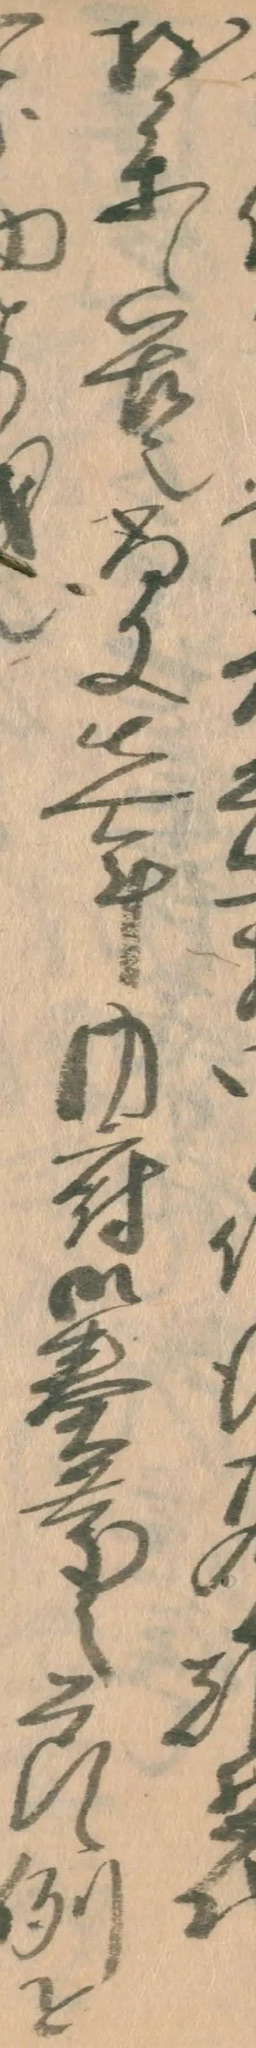持参候筈也尚又先年内府御奏慶之節之例を
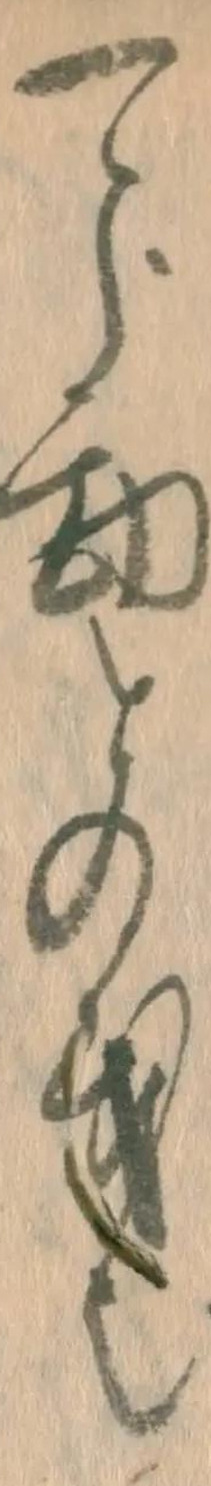可被勘との義也
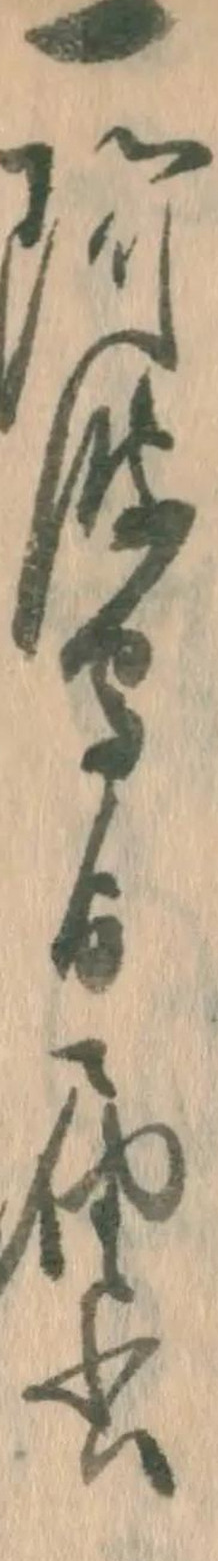一阿波守ゟ届書
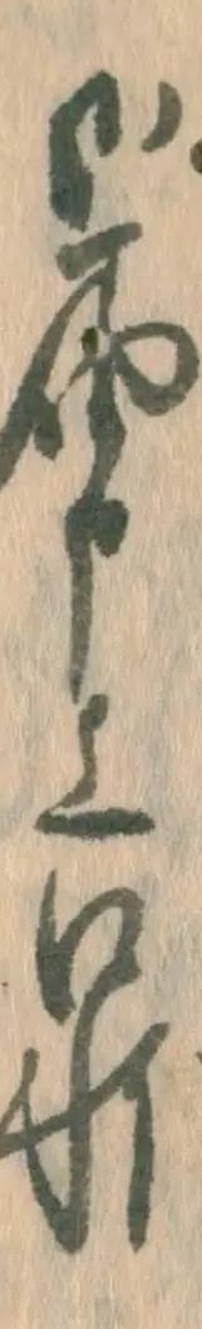御届申上同状
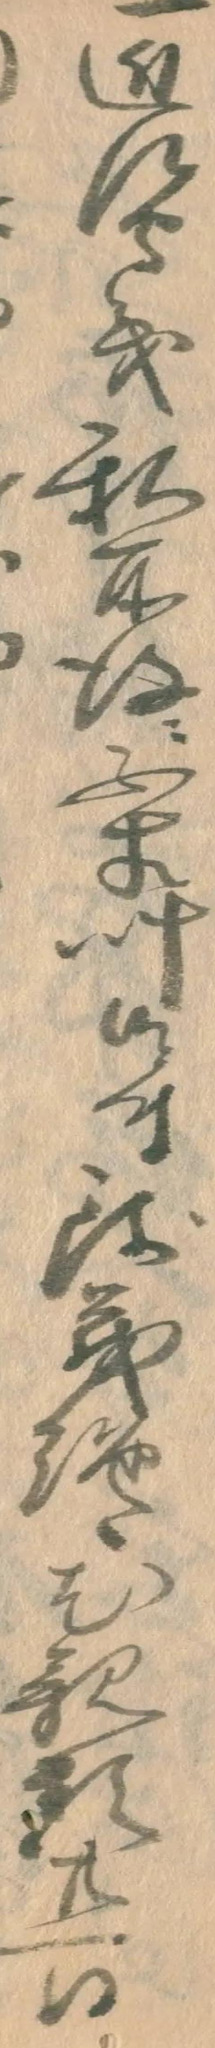一近江守義私所存ニ不相叶候ニ付致義絶候尤親類共一同
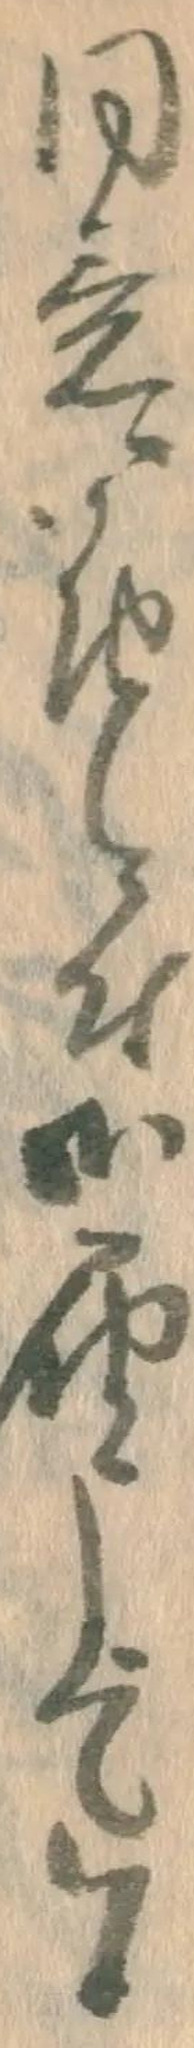同意ニ御座候ニ付御届申上候以上
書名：賀茂社記録. 第60冊
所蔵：国立国会図書館 National Diet Library, JAPAN
